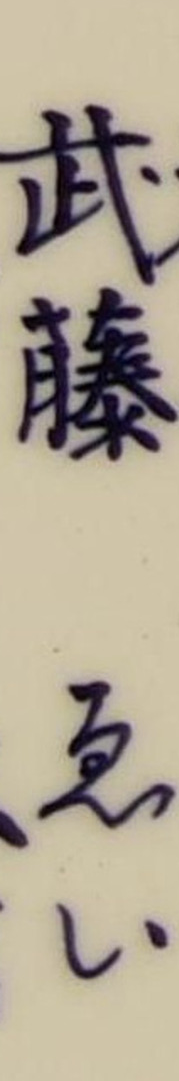武藤ゑい
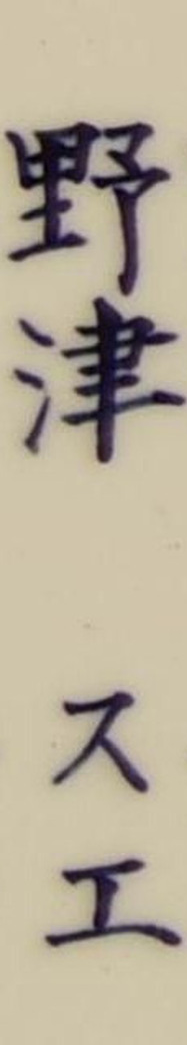野津ス工

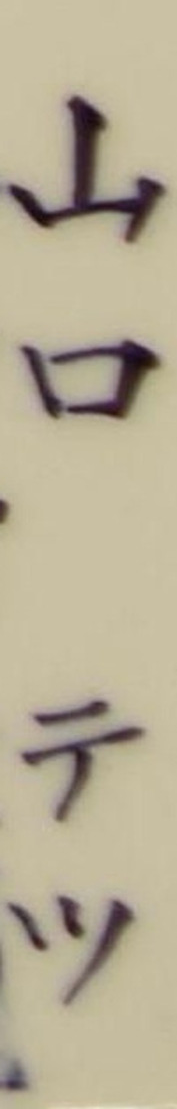山口テツ
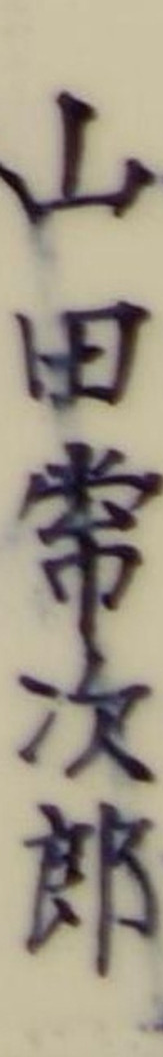山田常次郎
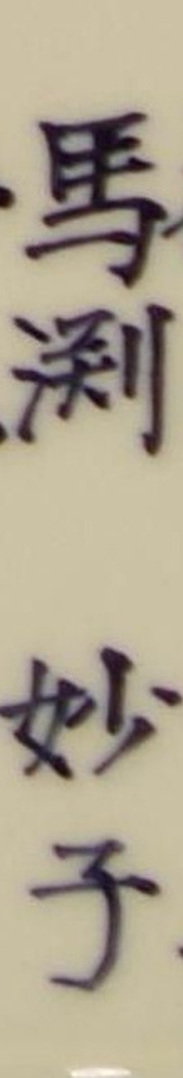馬渕妙子
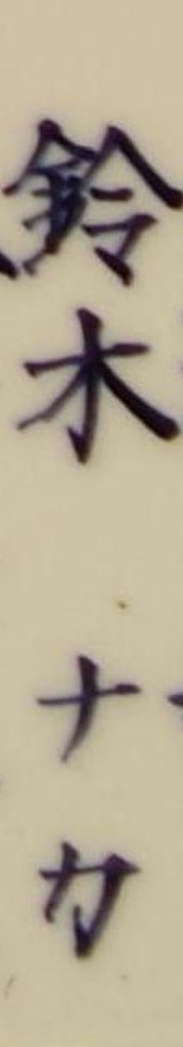鈴木ナカ
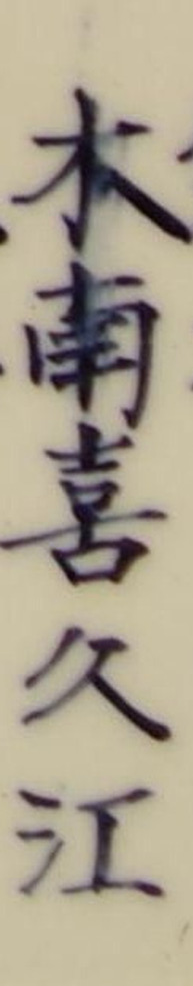木南喜久江
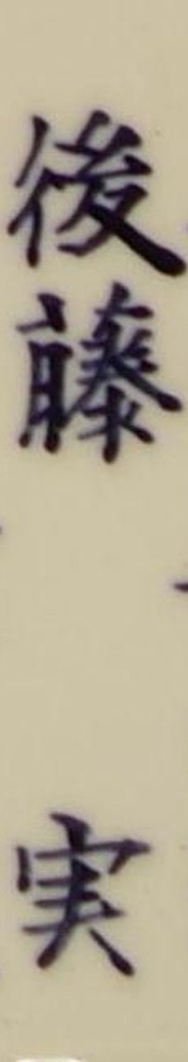後藤実
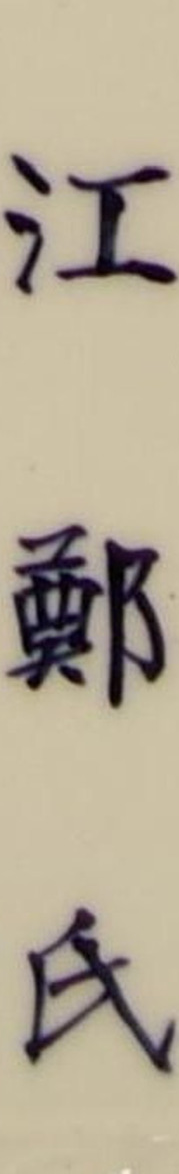江鄭氏
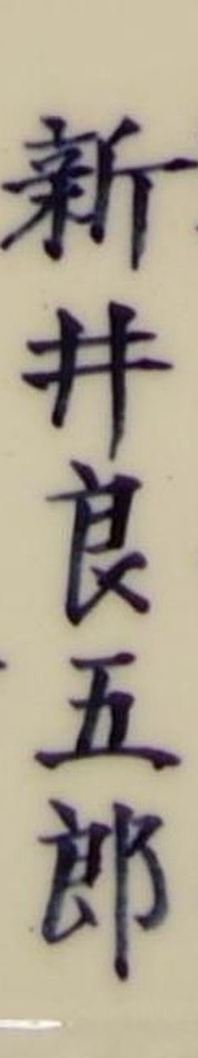新井良五郎
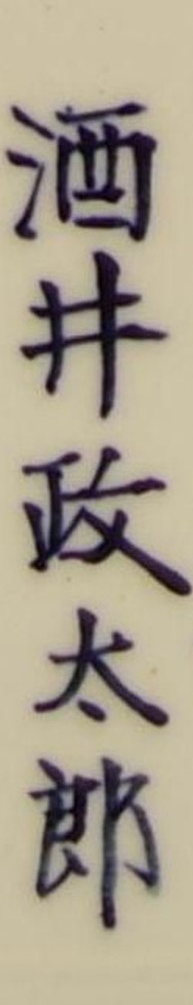酒井政太郎
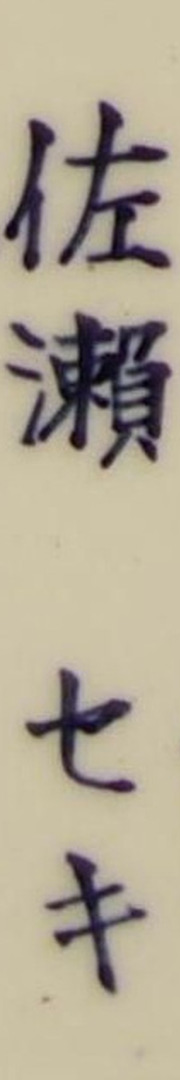佐瀬セキ
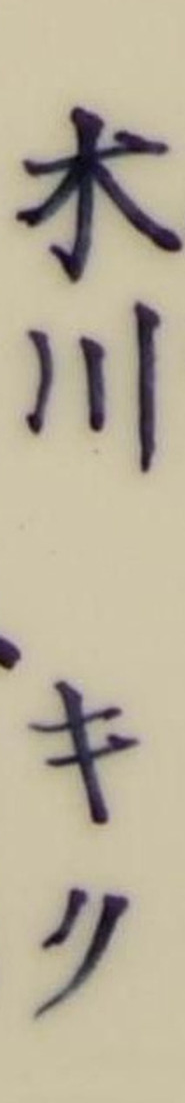木川キク
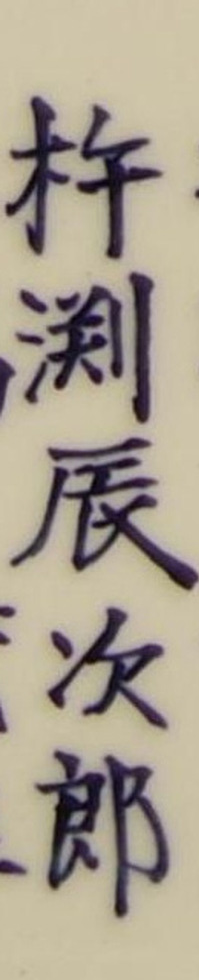杵淵辰次郎
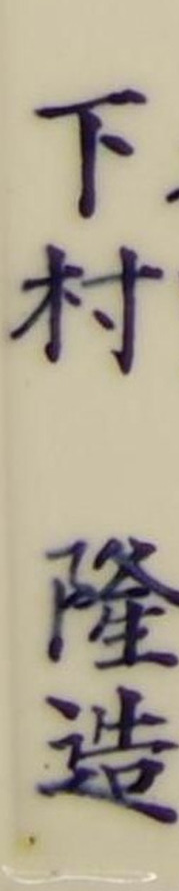下村隆造

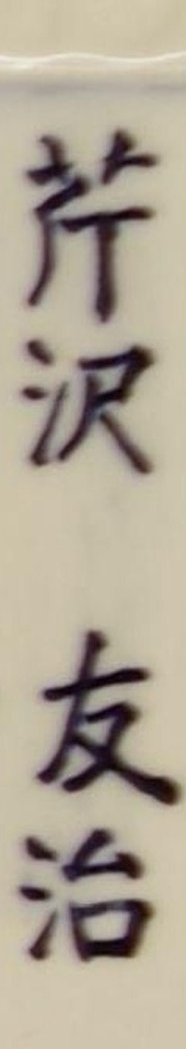芹沢友治
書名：E~L
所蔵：高野山金剛峯寺
